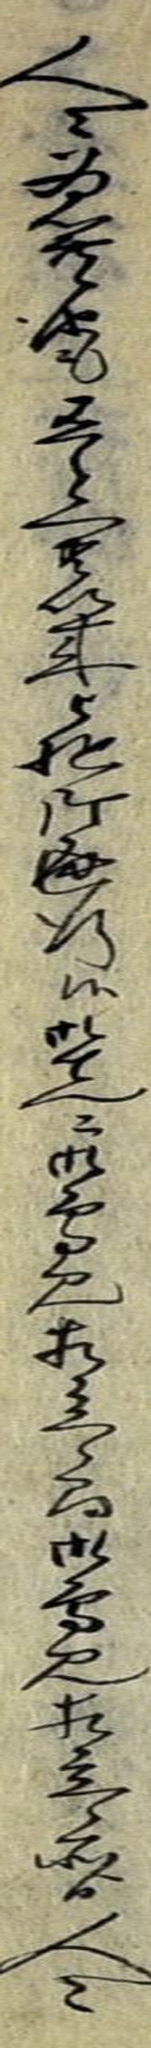人々為開候儀も有之候へ共以来被遊片通行候御先ニ御鳥見相立候間御鳥見相立候所ゟ人々
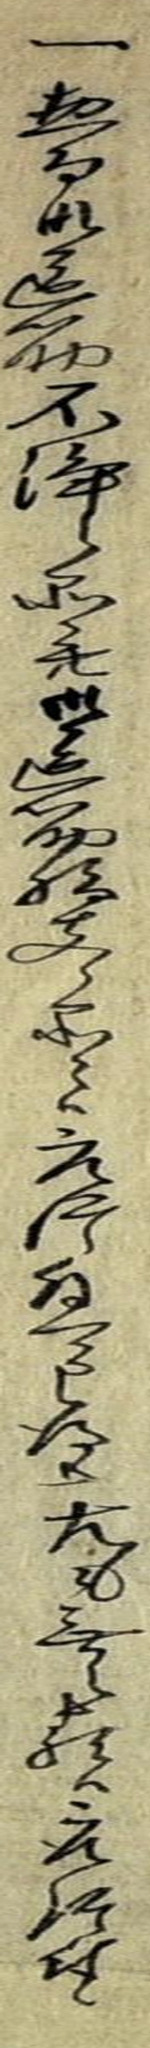一惣而御道筋不浄之品并御道筋指支候品候品々ハ取片付可申候得共左も無之類ハ取片付候
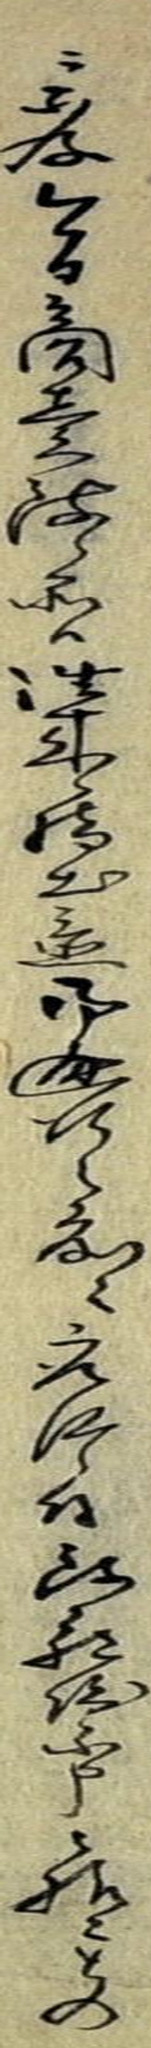ニ不及今日商売致候品ハ往来へ指出置御通行之度々取片付致難儀不申候様ニとの
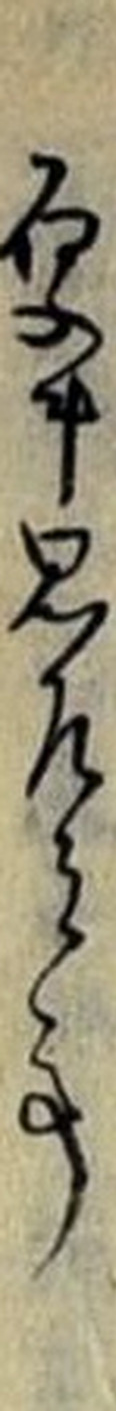厚キ思召ニ候事
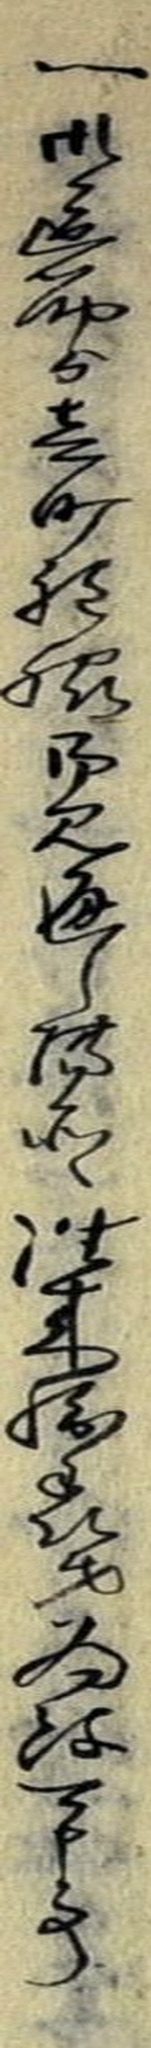一御道筋ゟ壱町程脇御見通し場所へ往来勝手次第為致可申事
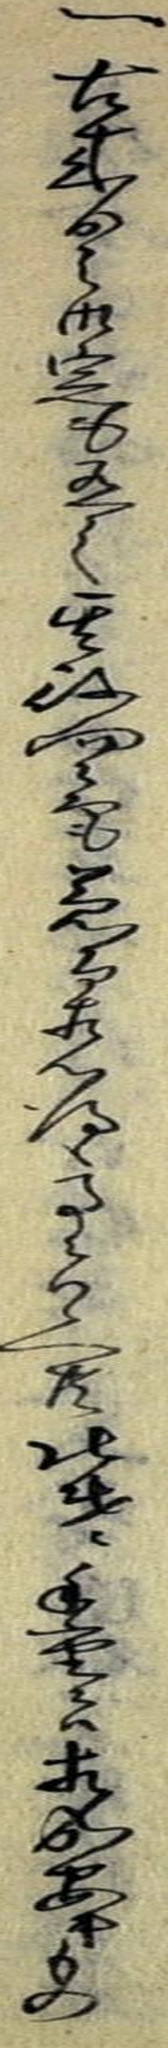一古来ゟ之御定も有之其役向ニ而も兼而相心得候事ニ候へ共次第ニ手重ニハ相成安キもの
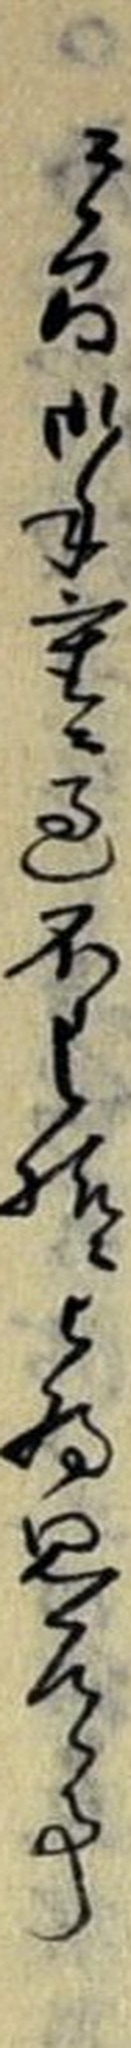ニ候間御手重ニ過不申様ニ被為思召候事
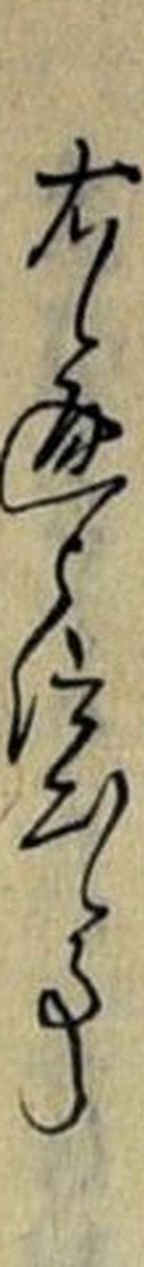右之通被仰出候事
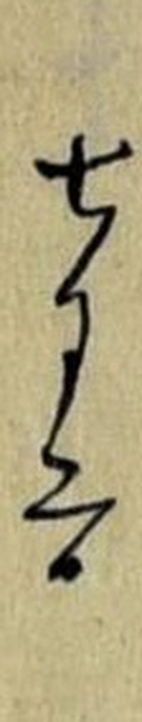七月二日
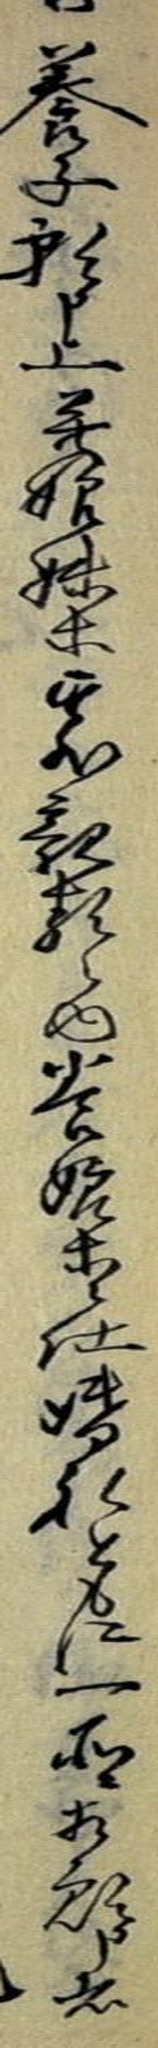〇養子願申上并娘妹等其外親類之内養娘等ニ仕婚礼ともに一所ニ相願申者
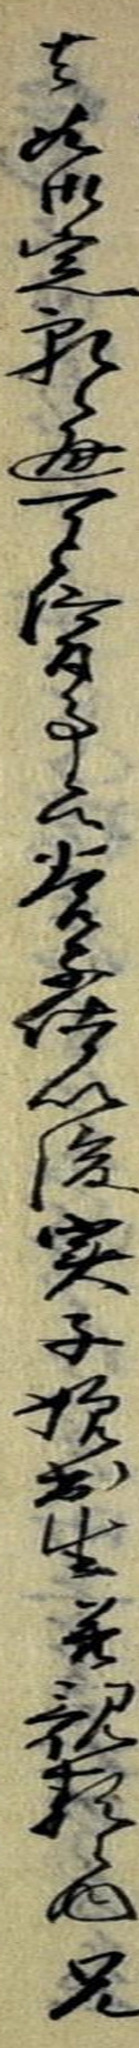者如御定願之通可被仰付事ニ候養子仕候以後実子娘出生并親類之内兄
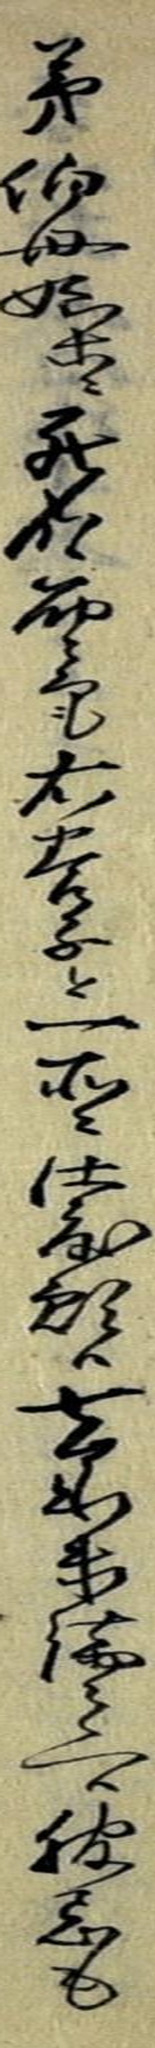弟伯母姪等ニ罷成候筋ニ而も右養子と一所ニ仕度願ハ七歳未満ニ候ヘハ服忌も
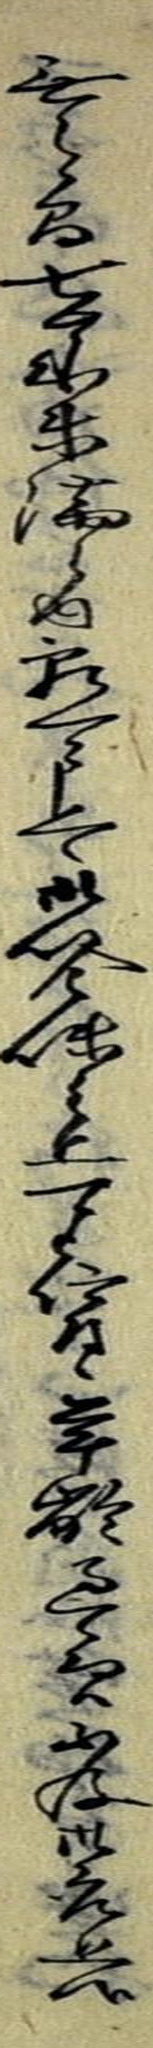無之候間七歳未満之内願可申上候御吟味之上可被仰付候年齢過候而ハ不及御取上候
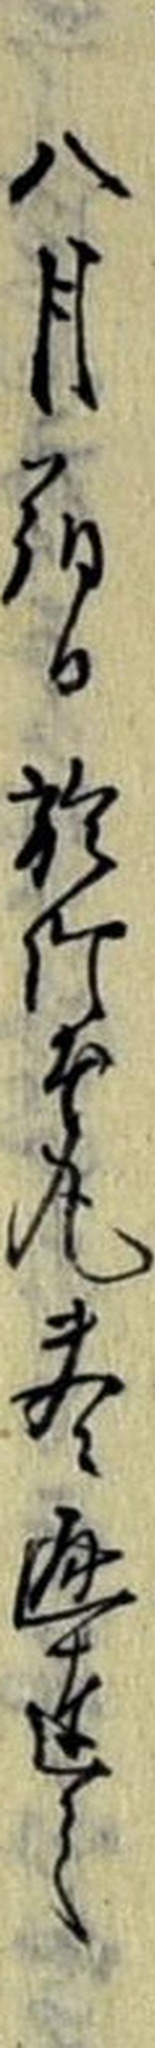八月朔日於御本丸夫々通達之
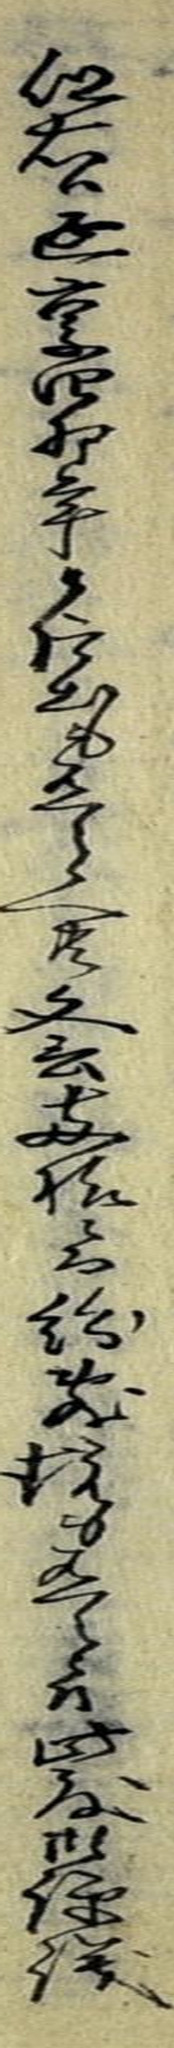但右ハ延享四卯年ニ仰出も有之候へ共文言両様ニ而紛敷趣も有之ニ付此度御評議
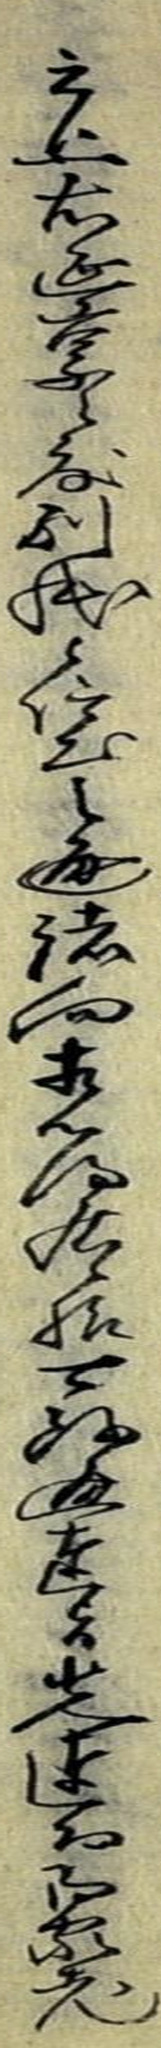之上右延享之度別紙被仰出之通諸向相心得居候様可致通達旨先達而御家老
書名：命令之部 三
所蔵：福井県文書館 Fukui Prefectural Archives
